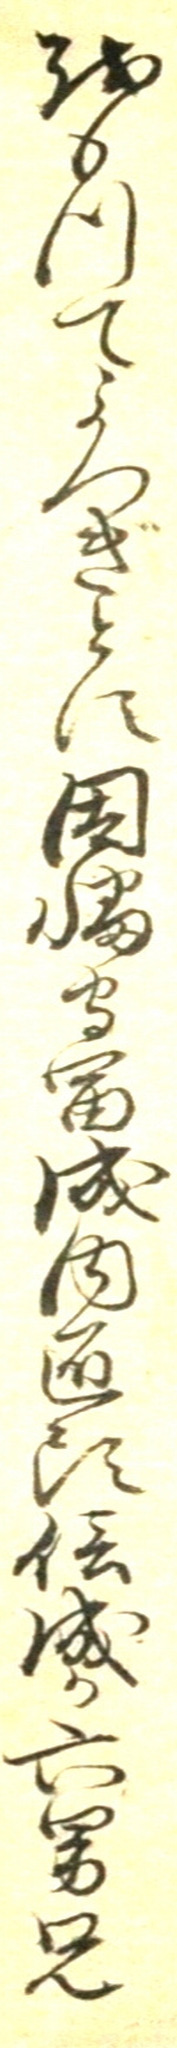をもつてよつぎとす因幡守富成内匠頭信成か六男兄
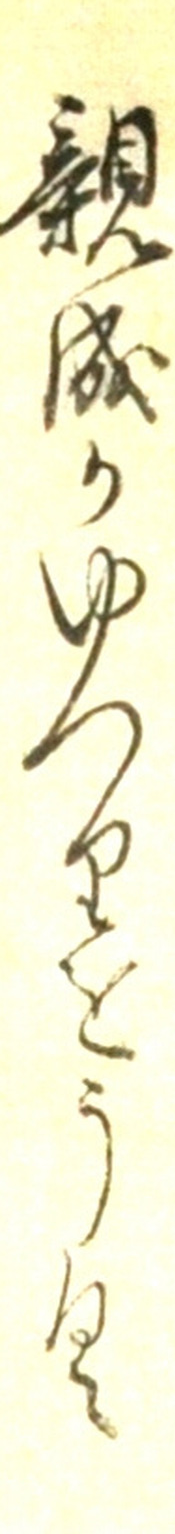親成かゆつりをうく

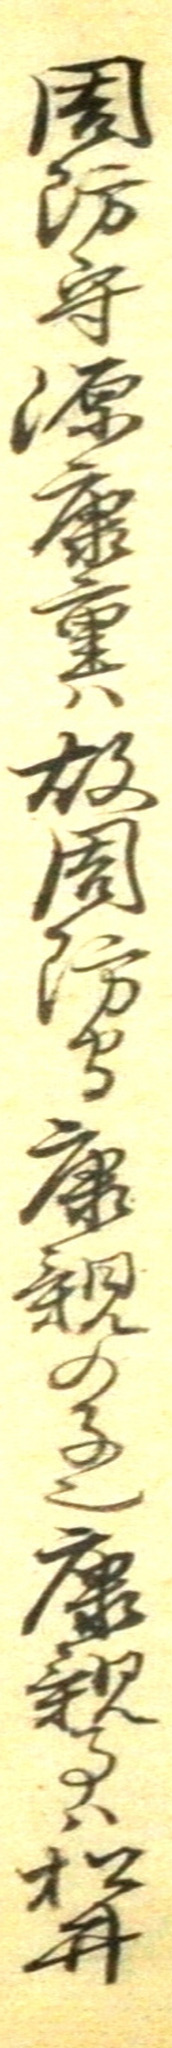周防守源康重は故周防守康親の子也康親事は松井
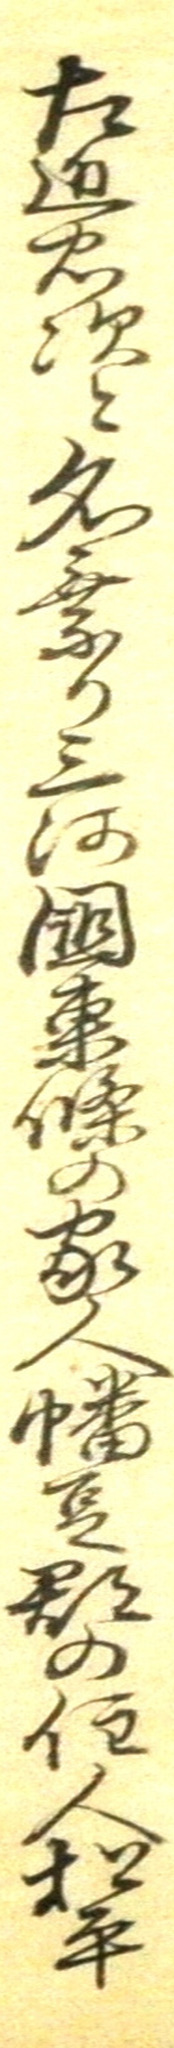左近忠次と名乗り三河国東条の家人幡豆郡の住人松平
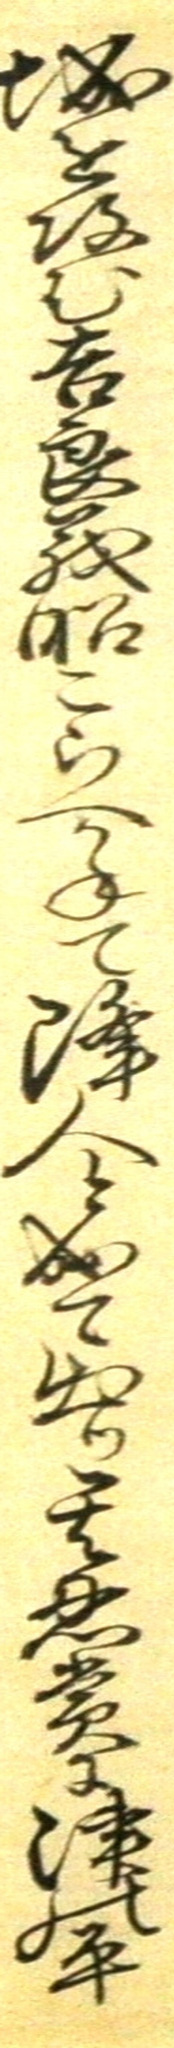城を攻む吉良義昭こらへかねて降人と成て出ッ其恩賞に津の平
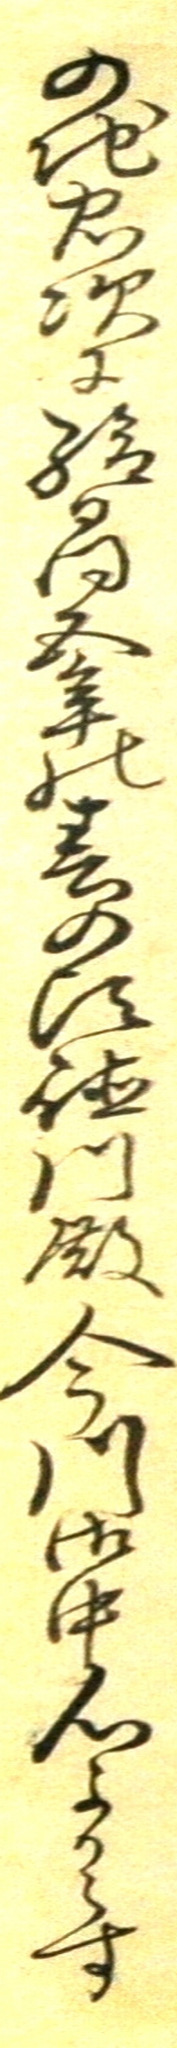の地忠次に給る同五年の春の頃徳川殿今川御中心よからす

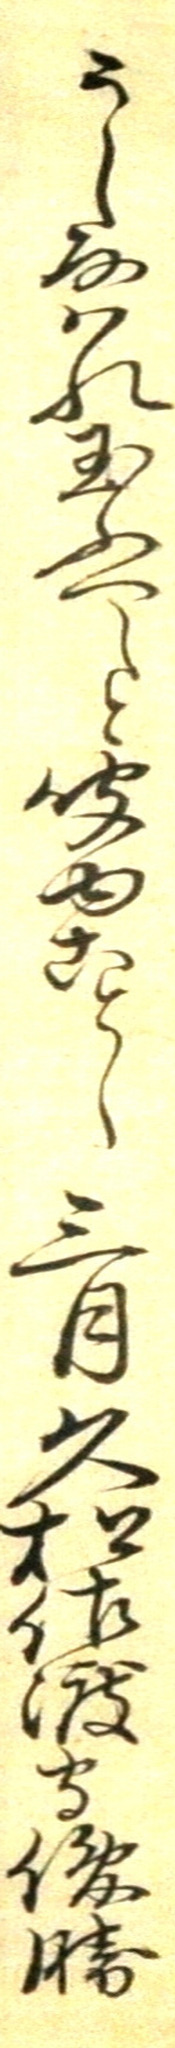うしなはれ玉ふへしと聞ゆことし三月久松佐渡守俊勝
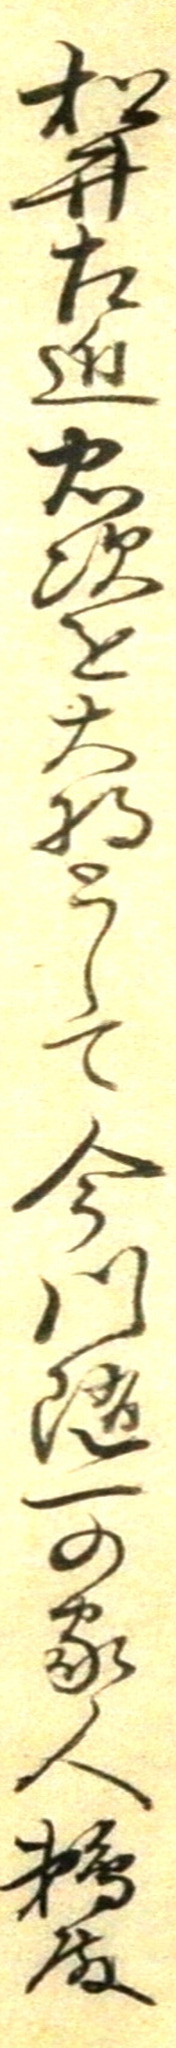松井左近忠次を大将として今川随一の家人鵜殿
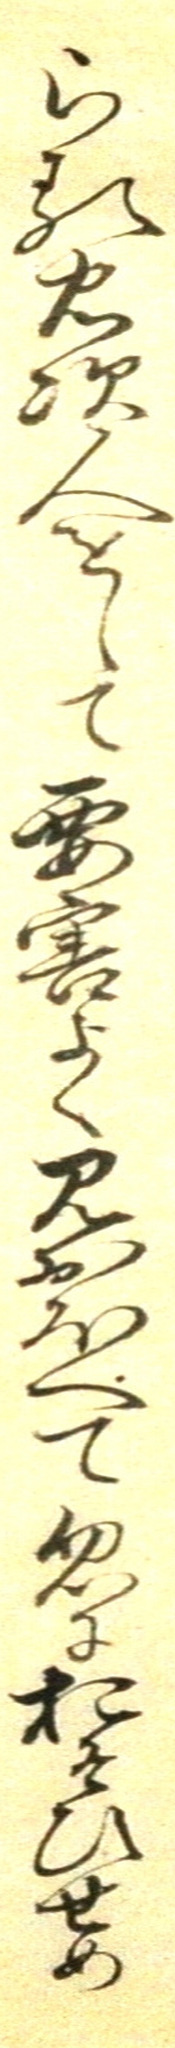らる忠次人をして要害よく見おほへて忽におそひせめ
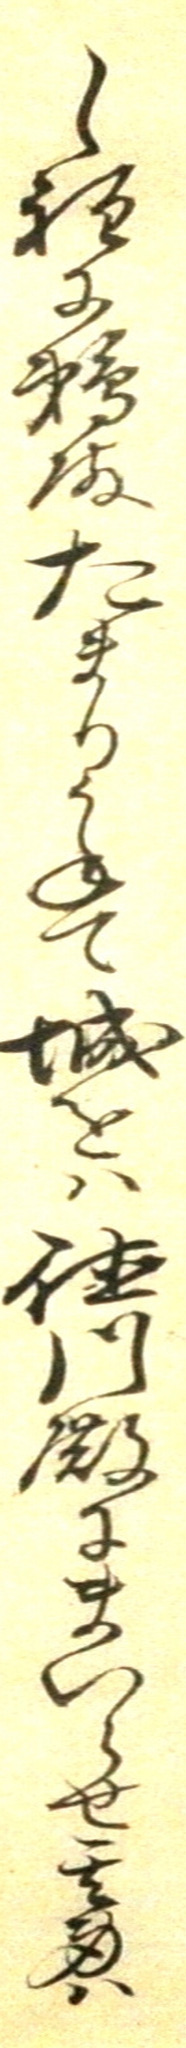し程に鵜殿たまりかねて城をは徳川殿にまいらせ其身は
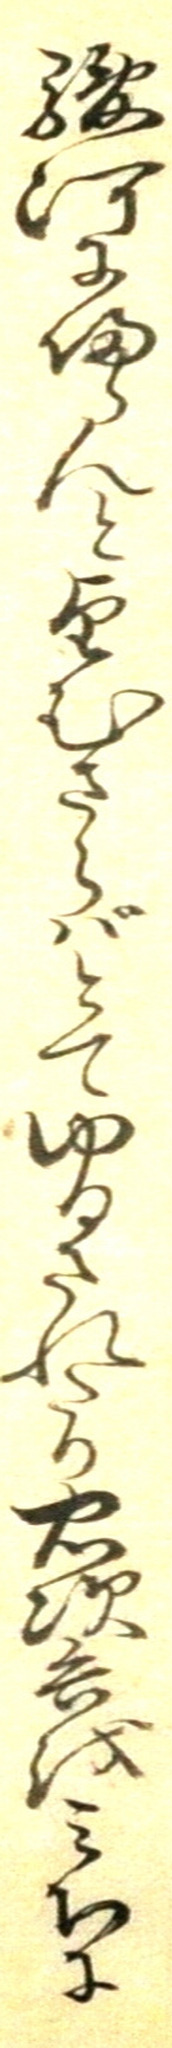駿河に帰らんと望むさらばとてゆるされたり忠次兵をみちに
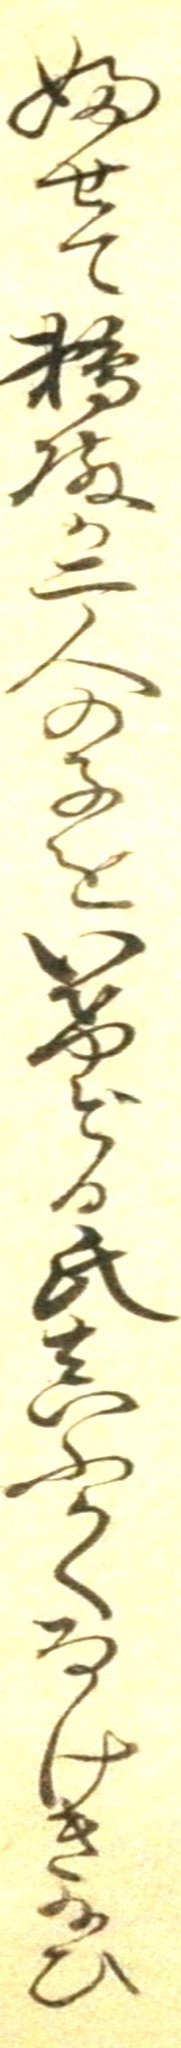ふせて鵜殿か二人の子をいけどる氏真ふかくなけき給ひ
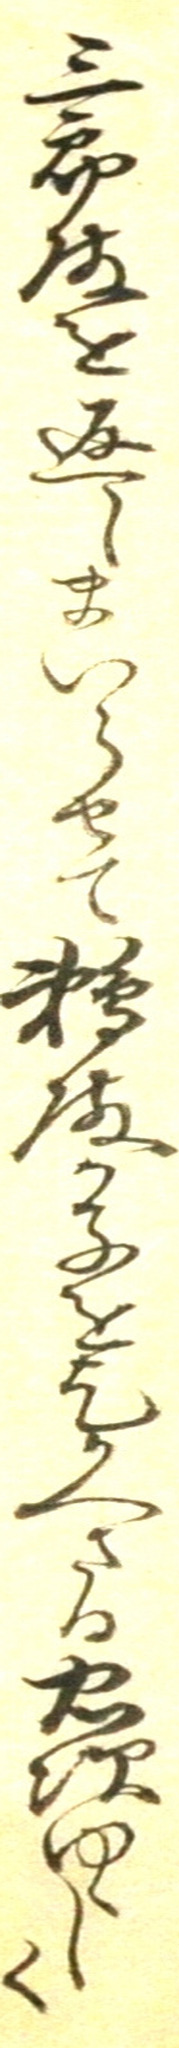三郎殿を返しまいらせて鵜殿か子を乞かへさる忠次ゆゝしく
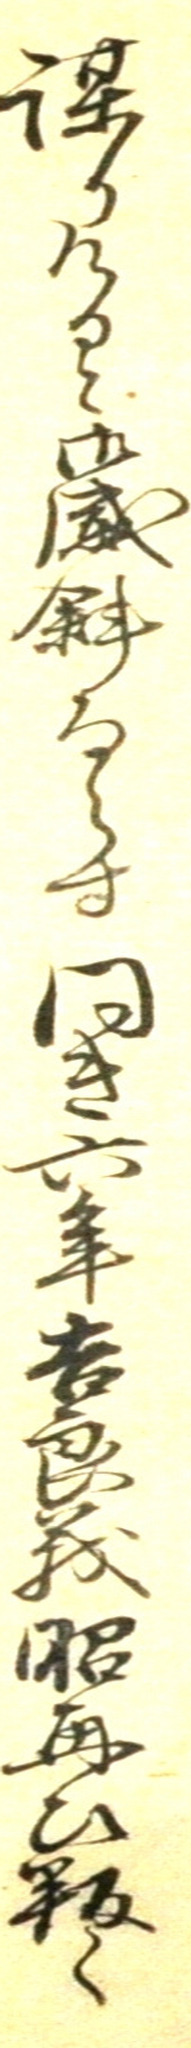謀りけると御感斜ならす同き六年吉良義昭再ひ叛く
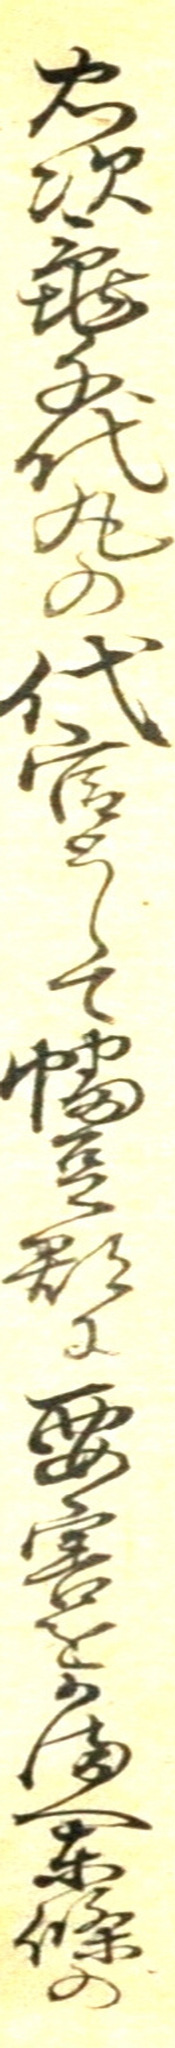忠次亀千代丸の代官として幡豆郡に要害をかまへ東条の
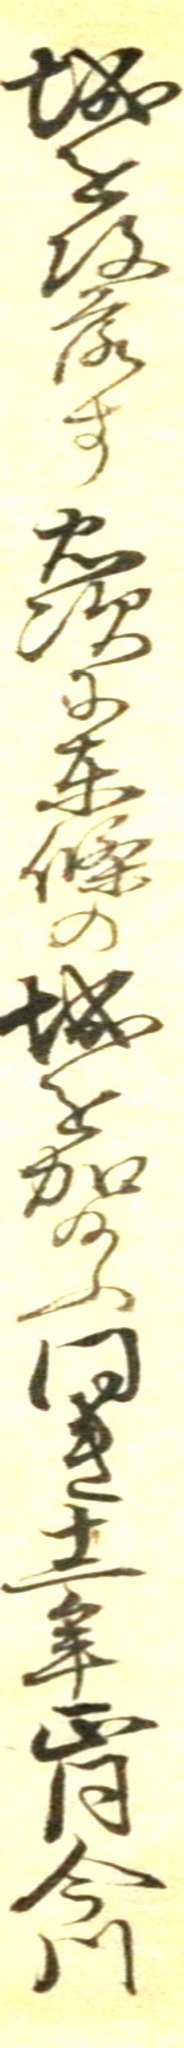城を攻落す忠次に東条の城を加給ふ同き十二年正月今川
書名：藩翰譜（四・下）
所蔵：伊那市立高遠町図書館・合同会社AMANE
